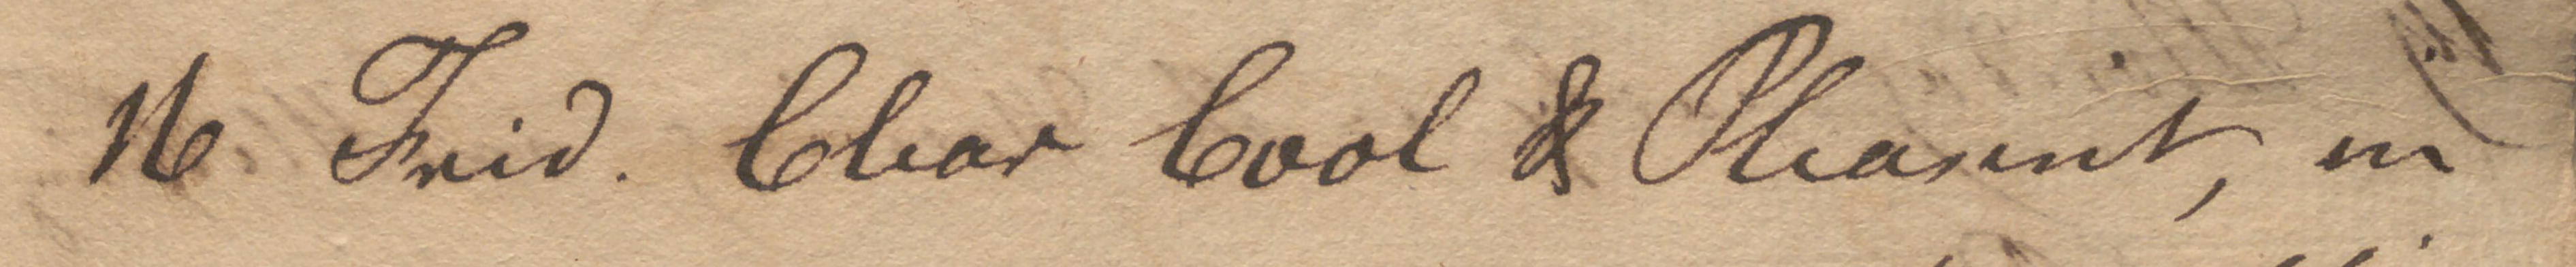16. Frid. Clear Cool & Pleasent in
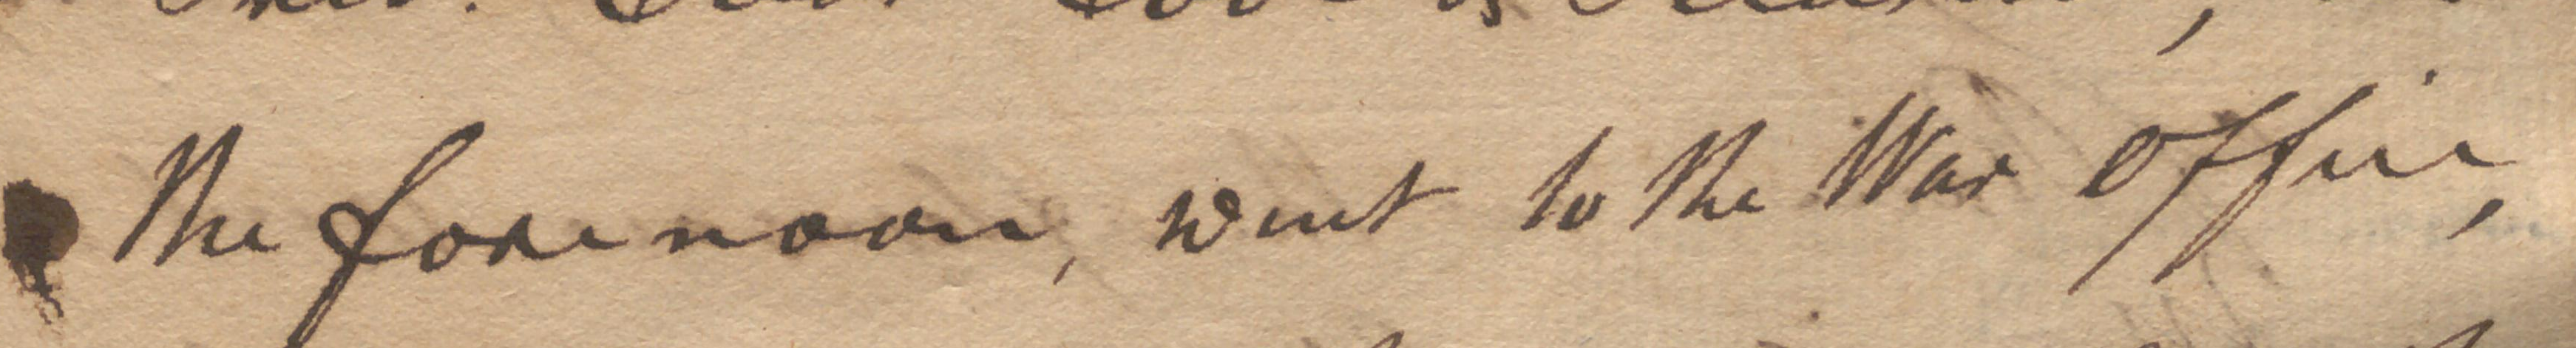the forenoon, went to the War office
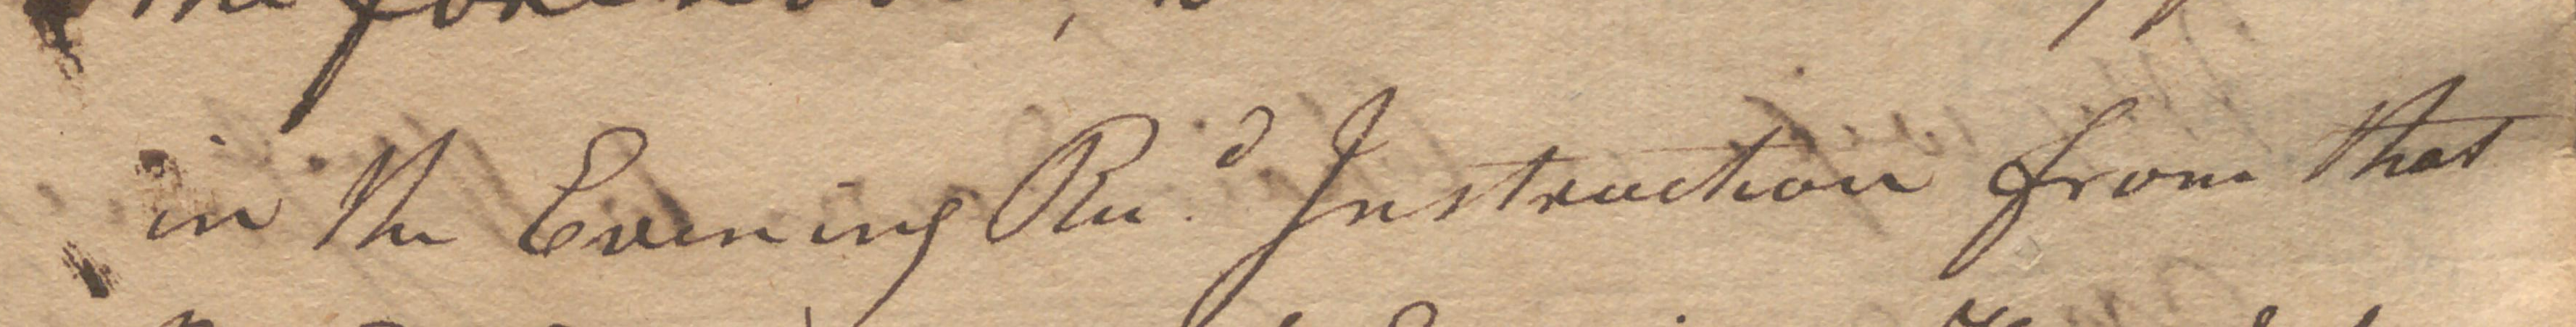in the Evening Rec^d. Instruction from that
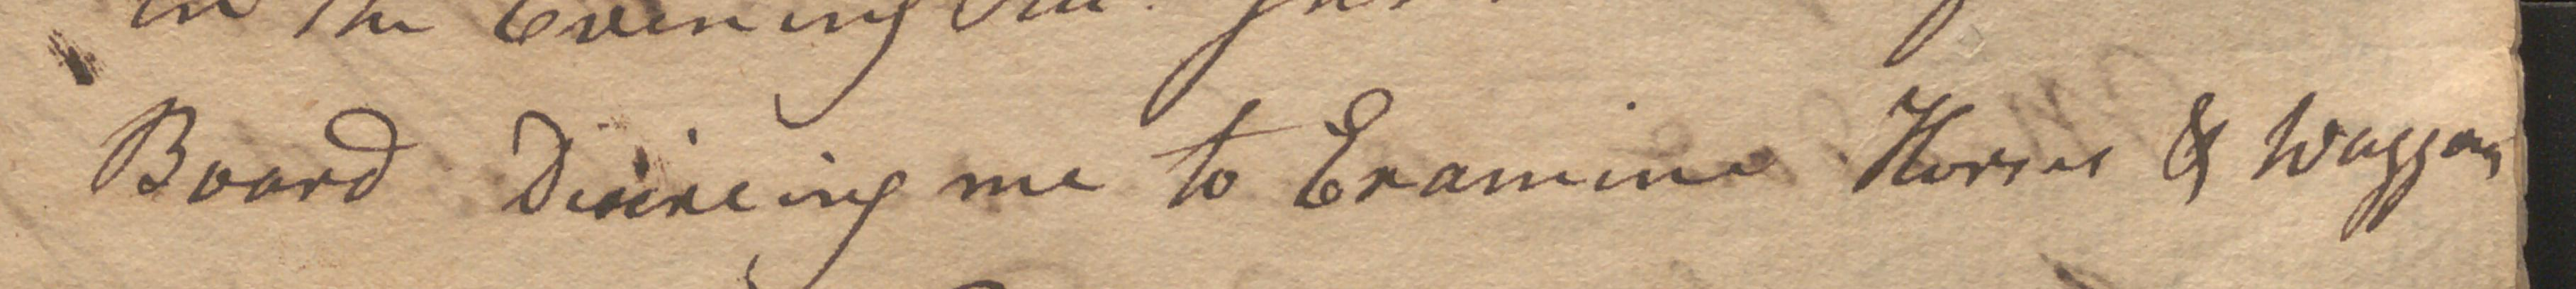Boord desireing me to Examine Horses & waggons
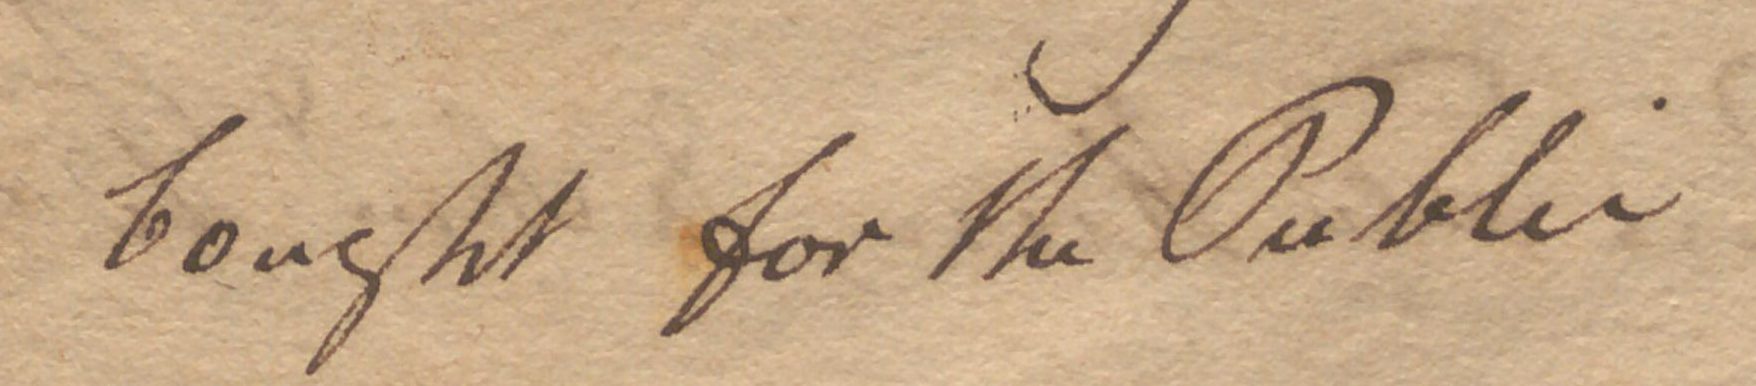bought for the Public
